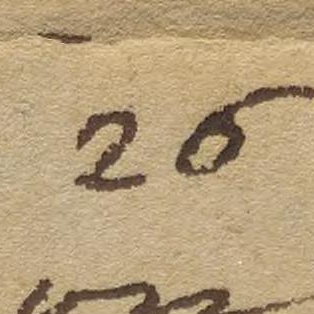26
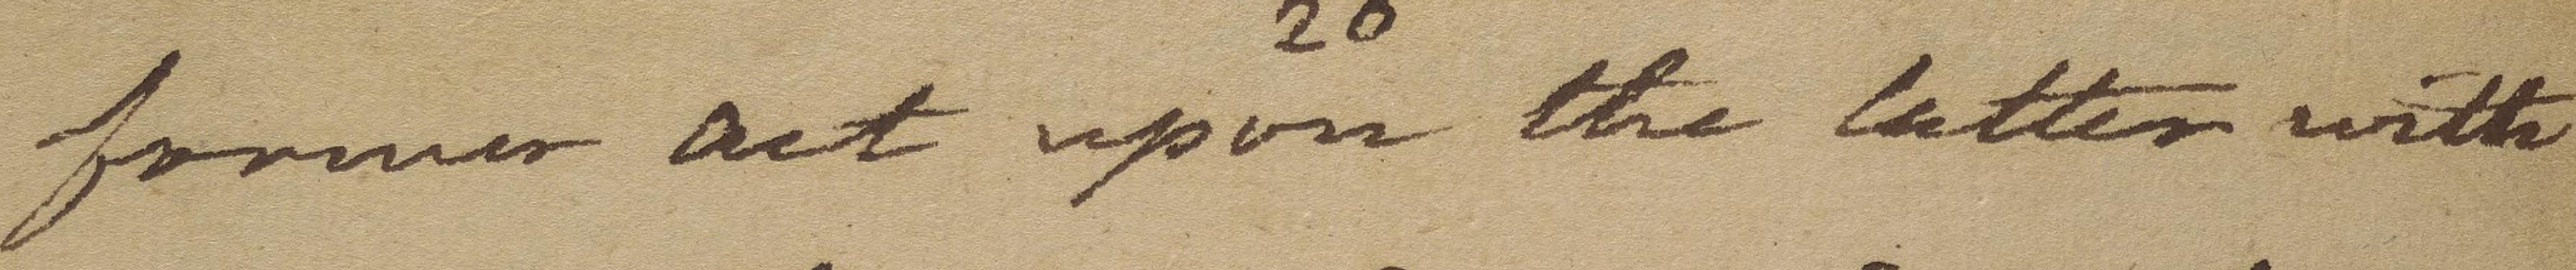forces upon the latter with
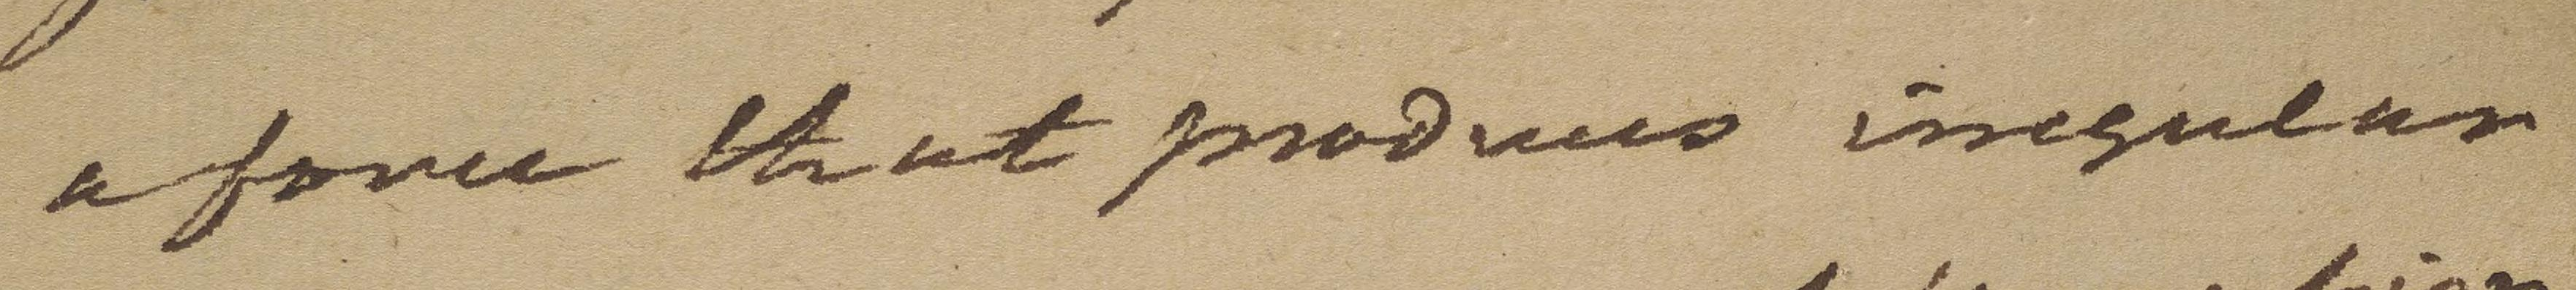a force that produces irregular
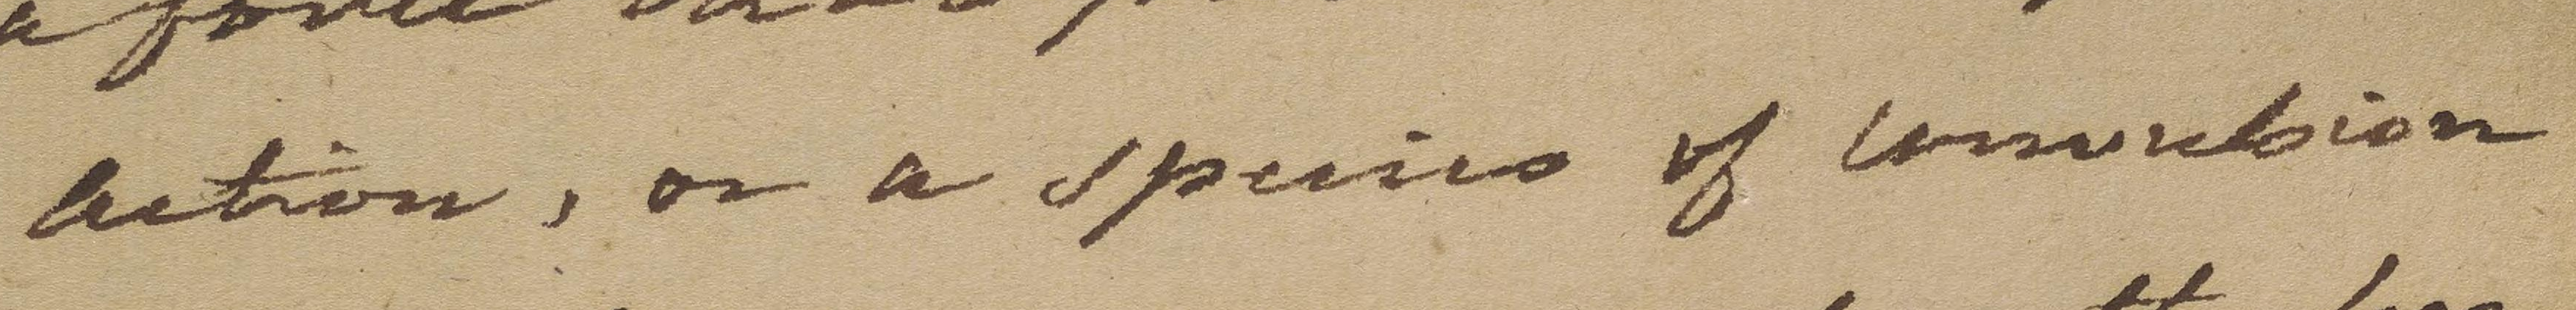action, or a species of convulsion
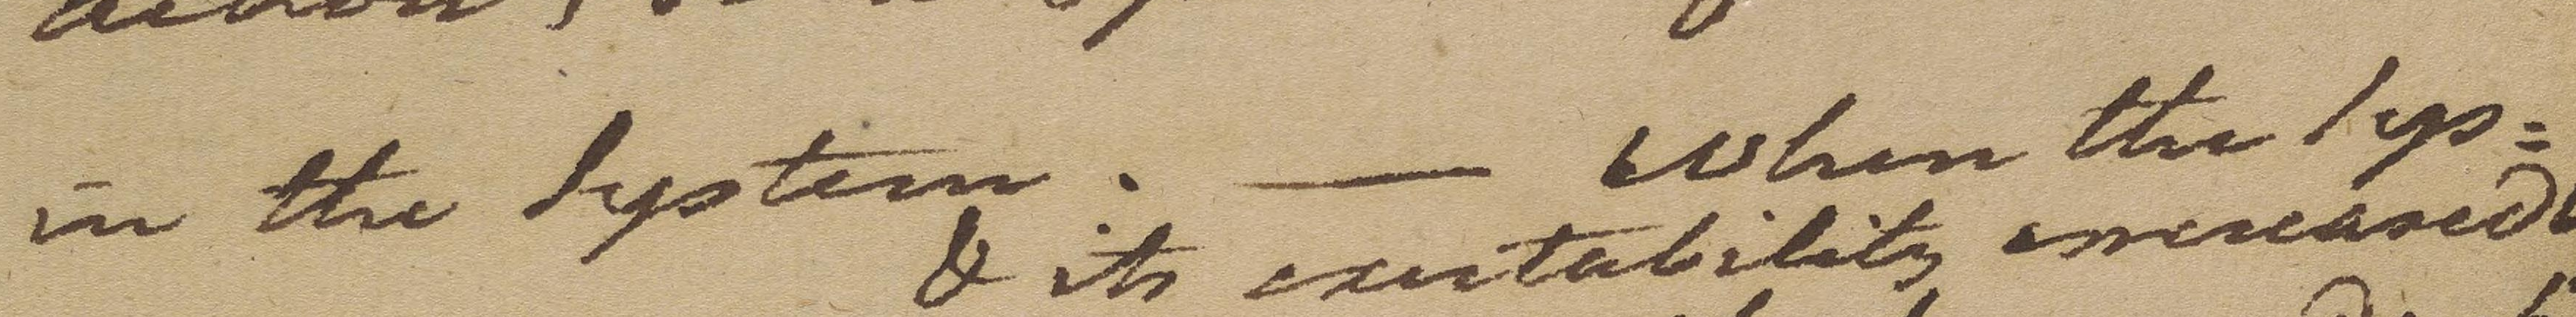in the sytem. When the sys-
